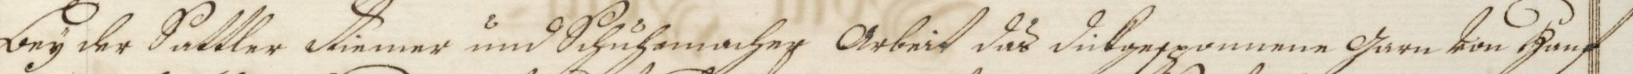Bey der Sattler Riemer und Schuhemacher Arbeit das dickgesponnene Garn von Hanf
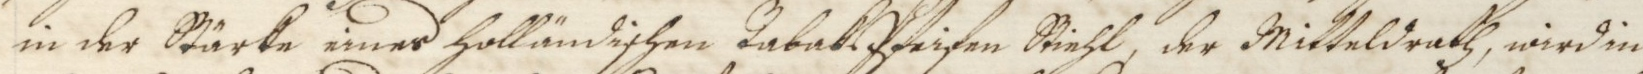in der Stärke eines holländischen Tabak Pfeifen Stiehl, der Mitteldrath, wird in
